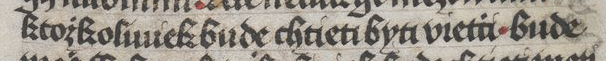ktożkoluiek bude chtieti byti vietċi.bude
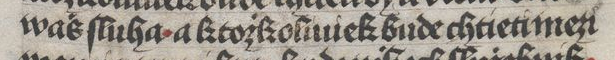waš ſluha.a ktozkoliuiek bude chtíeti mezi
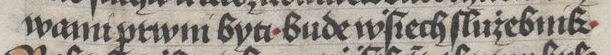wamí prwni byti.bude wẛiech ſlużebník.
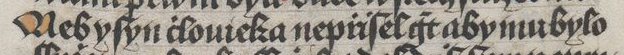Neb y ſyn ċlouieka nepṙiẛel ḡt aby mu bylo
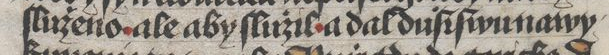ſluženo.ale aby ſlužil. a dal duẛi ſwu na wy¬
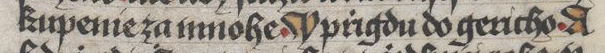kupenie za mnohé.Y pṙigdu do gericho.A
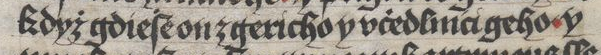když gdíeẛe on z gericho y vċedlníci geho.y
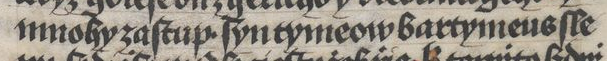mnohy zaſtup ſyn tymeow bartymeus ſle¬
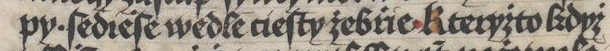py.ſedíeẛe wedle cieſty žebṙie.Kterýżto kdyż
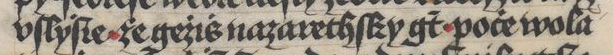vſlyẛíe.że geżíṡ nazarethſky ḡt poce wola¬
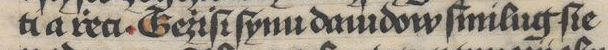ti a ṙeci.Geżiẛi ſynu dawidow ſmilug ſie
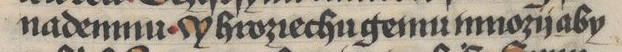nade mnu.Y hroziechu gemu mnozij aby
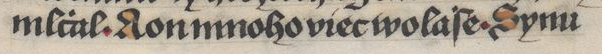mlċal.A on mnoho wiec wolaẛe.Synu
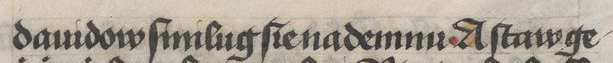dauidow ſmilug ſie nade mnu.A ſtaw ge¬
